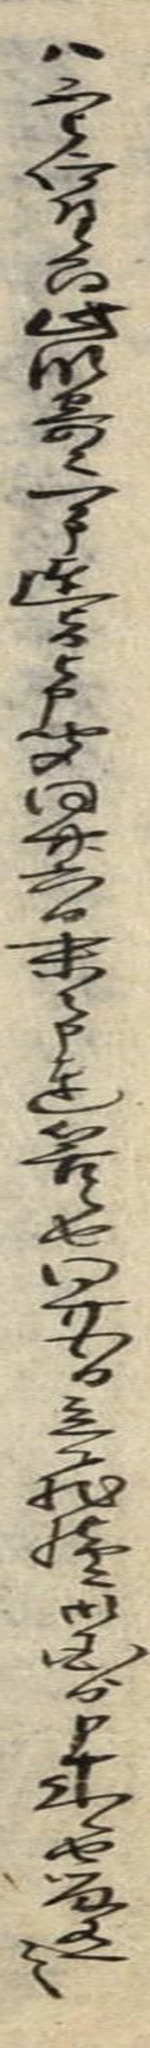ハ不被仰付候間此段寄々可申達旨被申聞同廿六日末々申達筈之由同廿五日立飛脚ニ御国ゟ申来候由留有之
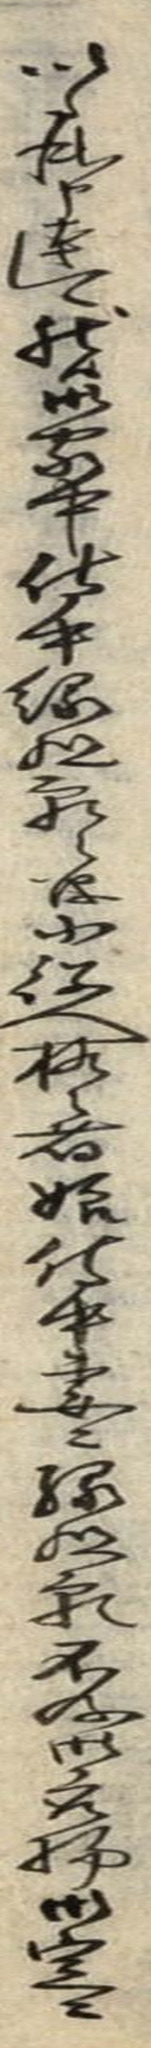以紙申達候然ハ御家中侍中縁組願之儀小役人格之者娘侍中妻ニ縁組願不及御取揚御定ニ
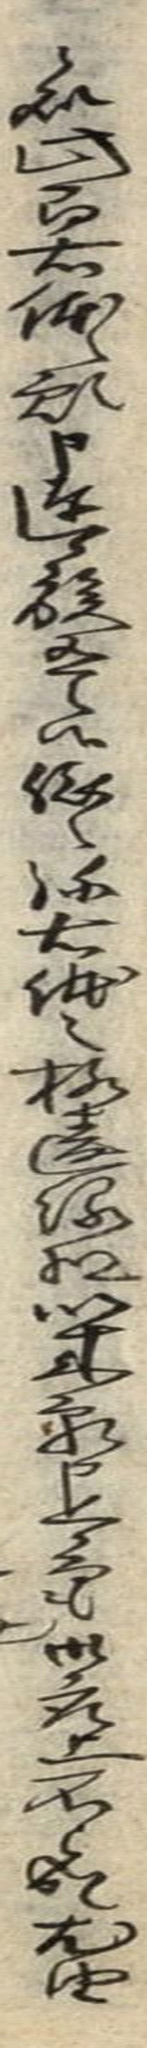候処此間右体之願申達候族有之候依之弥右体之格違縁組以来願申上候而も御取上不被成候尤由
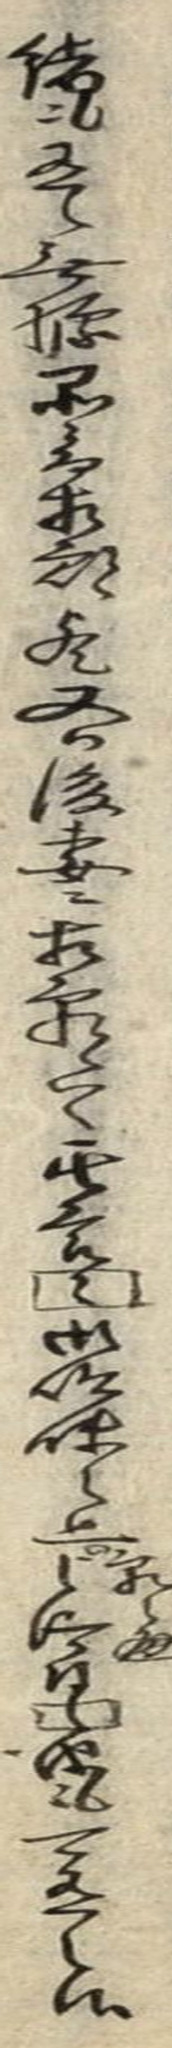緒も有之無拠品ニ而相願候歟又ハ後妻ニ相願候ハヽ其節々御吟味之上願之通被仰付候儀も可有之候
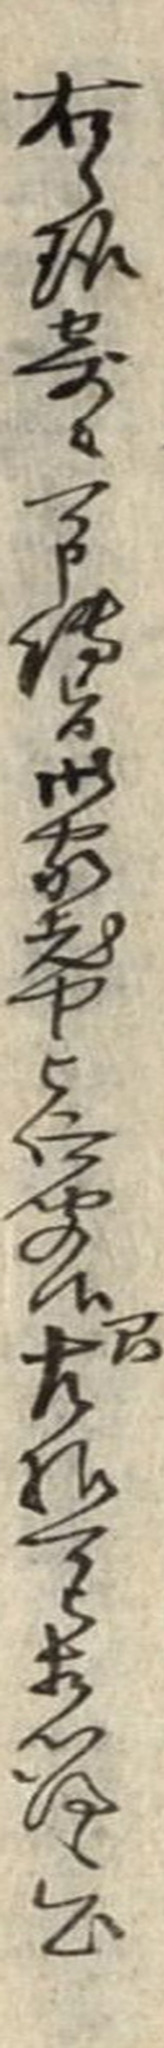右之趣寄々可申伝旨御家老中被仰聞候間左様可被相心得候以上
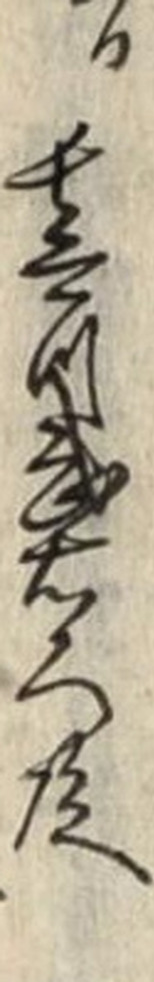長谷川武右衛門殿
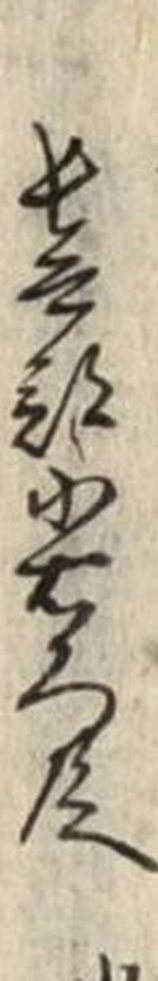長谷川武右衛門殿
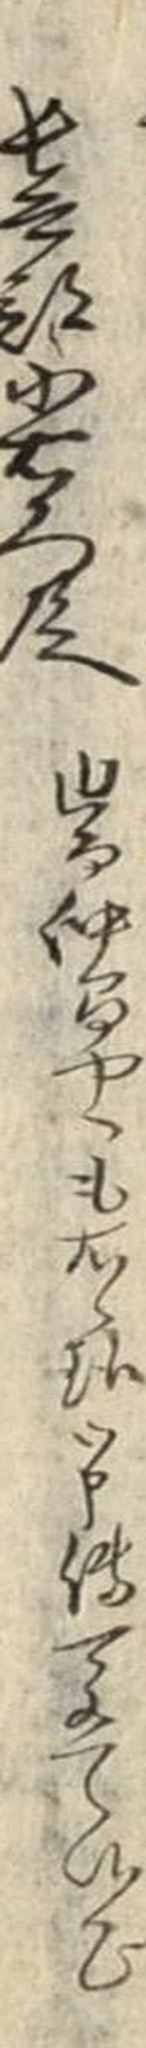長谷部小右衛門殿追而仲間中へも右之趣御申伝可有之候以上
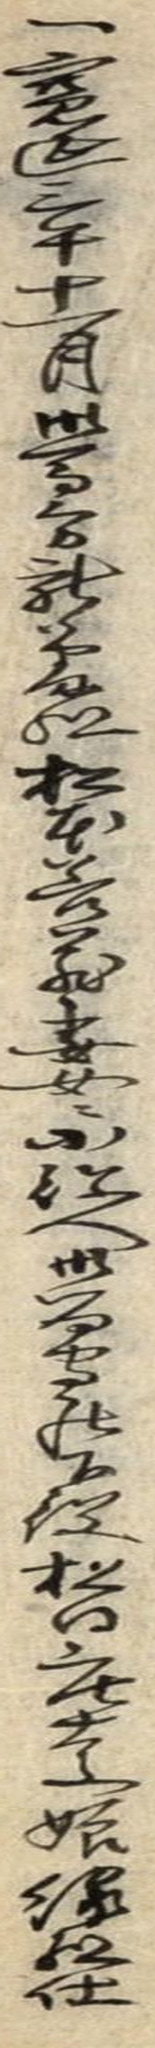一寛延三午十一月御馬方新番組松本善蔵妻女ニ小役人御留守居下役松田庄太夫娘縁組仕
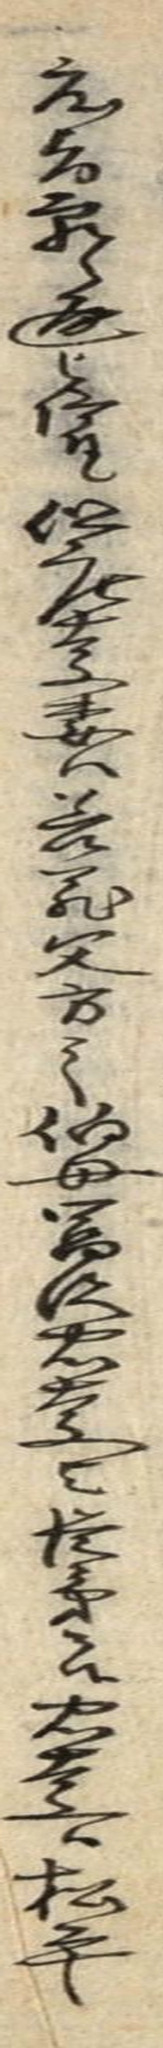度旨願之通被仰付候但庄太夫妻ハ善蔵父方之伯母富沢忠太夫と従弟ニ候忠太夫ハ松平
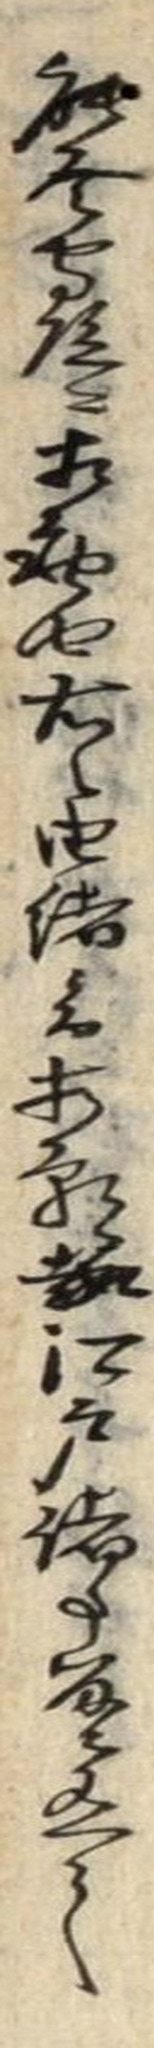能登守殿ニ相勤候由右之由緒ニ而相願候趣江戸諸事留ニ有之

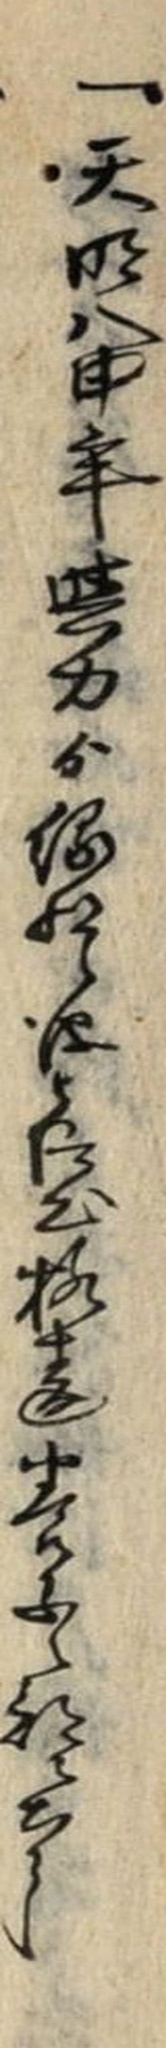一天明八申年与力ゟ縁組之儀被仰出格違養子之部ニ出之
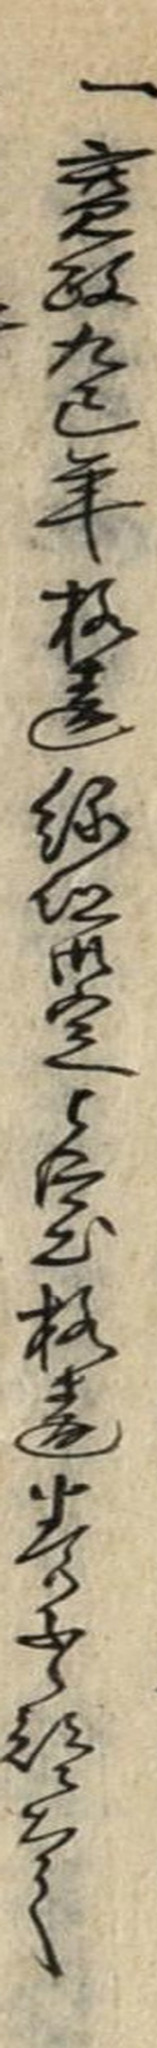一寛政九巳年格違縁組御定被仰出格違養子之部ニ出之
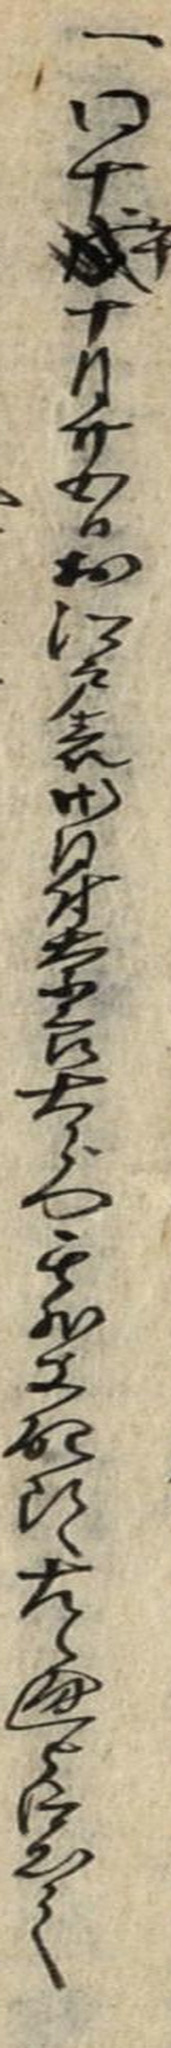一同十午十月廿五日於江戸表御目付奈良太郎右衛門其外支配頭へ左之通被仰出之
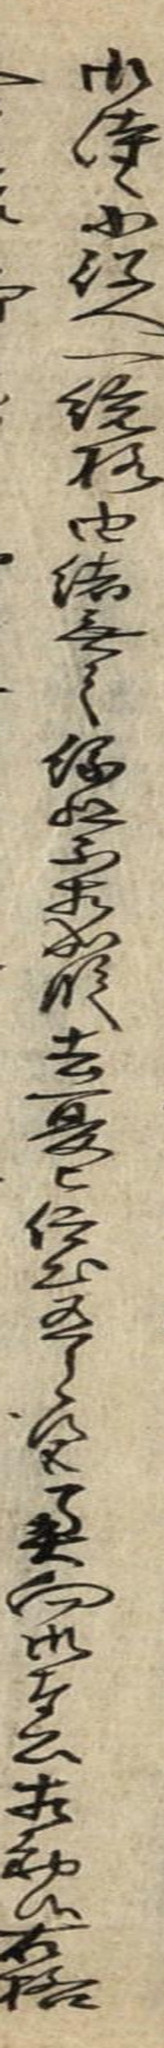御侍へ小役人一統格由緒無之縁組不相成段去夏被仰出有之候得共奥向御奉公相勤候右格
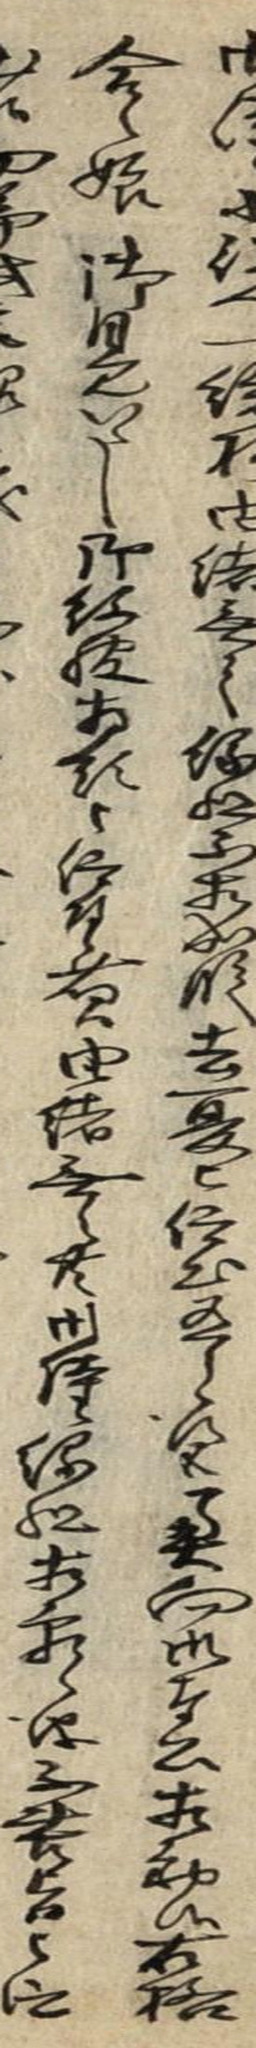合之娘御目見いたし御紋服拝領被仰付候者ハ由緒無之共御侍之へ縁組相願候儀不苦旨被仰
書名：養子縁組之部
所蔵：福井県文書館 Fukui Prefectural Archives
